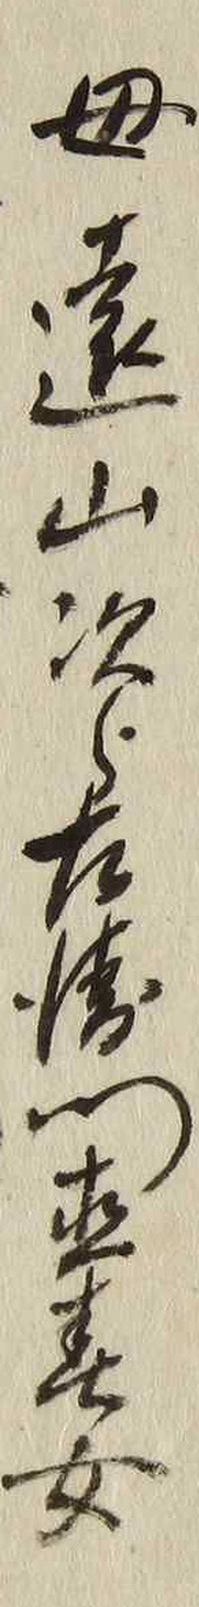母遠山次郎左衛門直春女
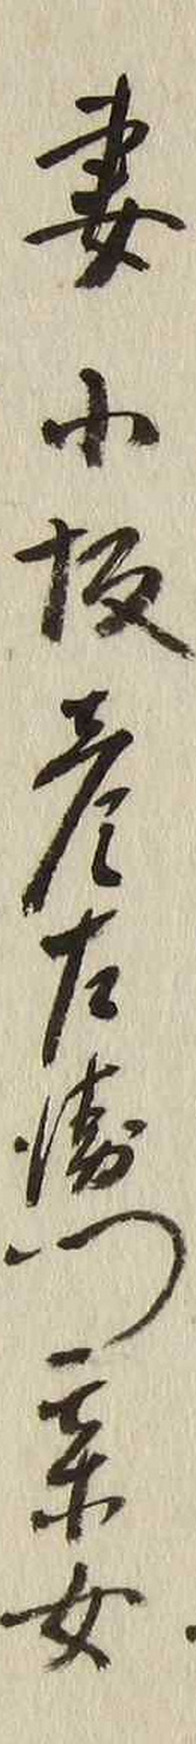妻小坂彦左衛門某女
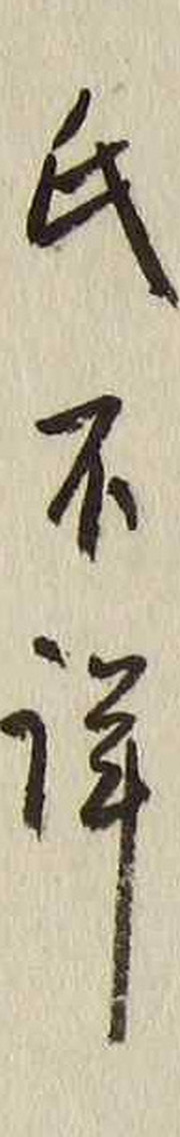氏不詳
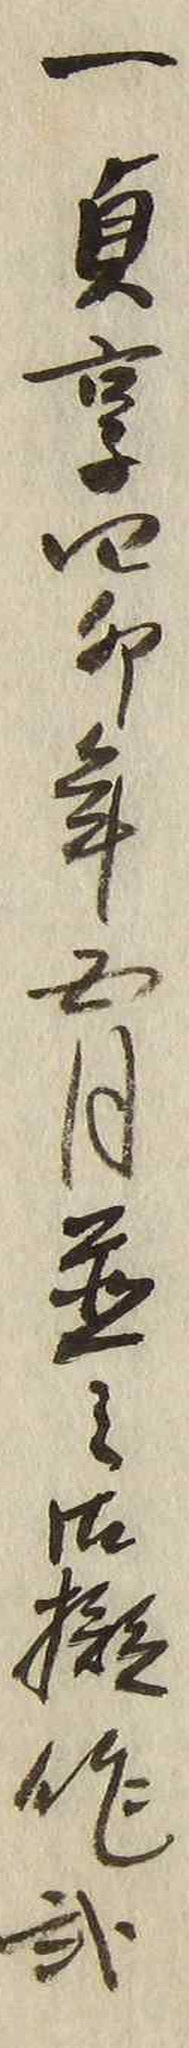一貞享四卯年五月並之御擬作弐

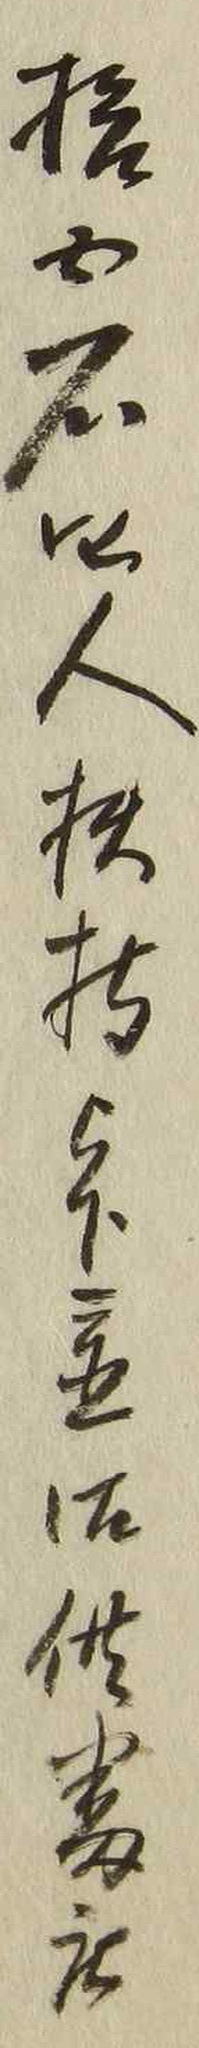拾五石四人扶持被下置御供番被
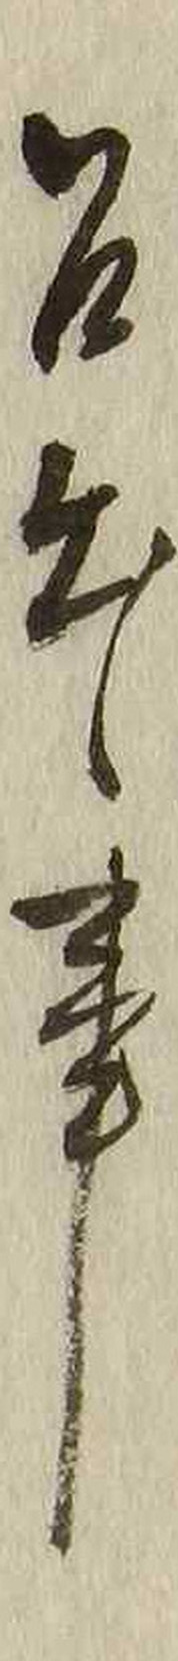召出候事
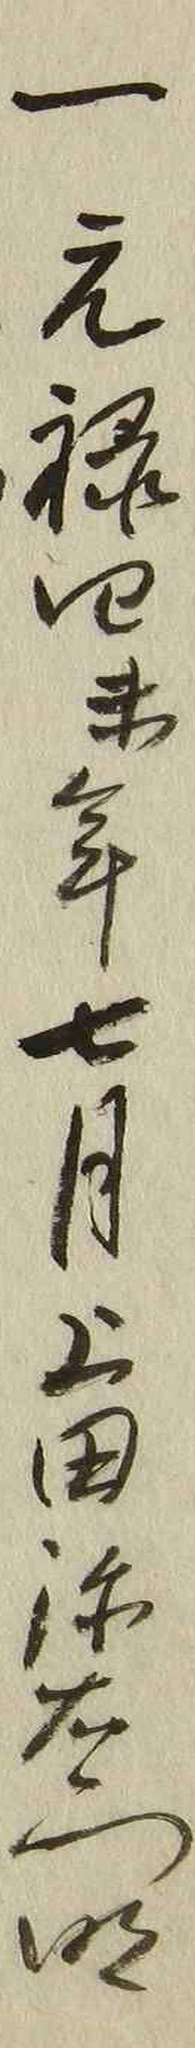一元禄四未年七月上田弥右衛門明
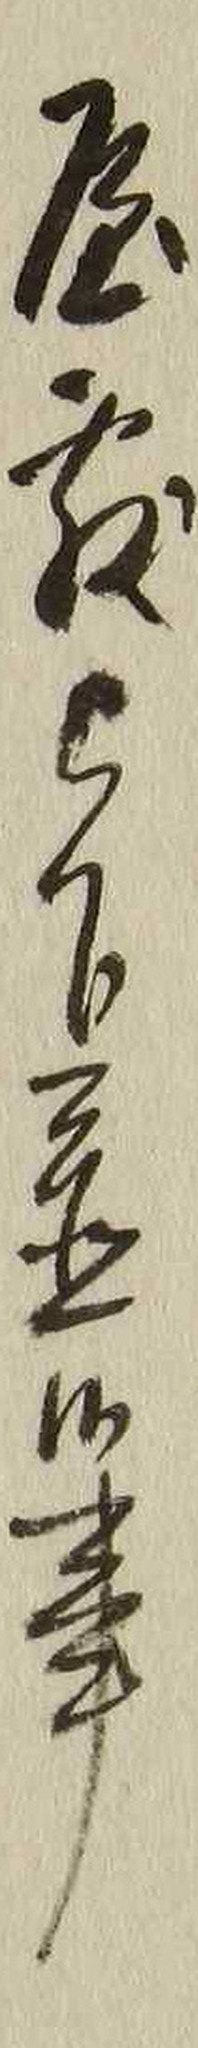屋敷被下置候事
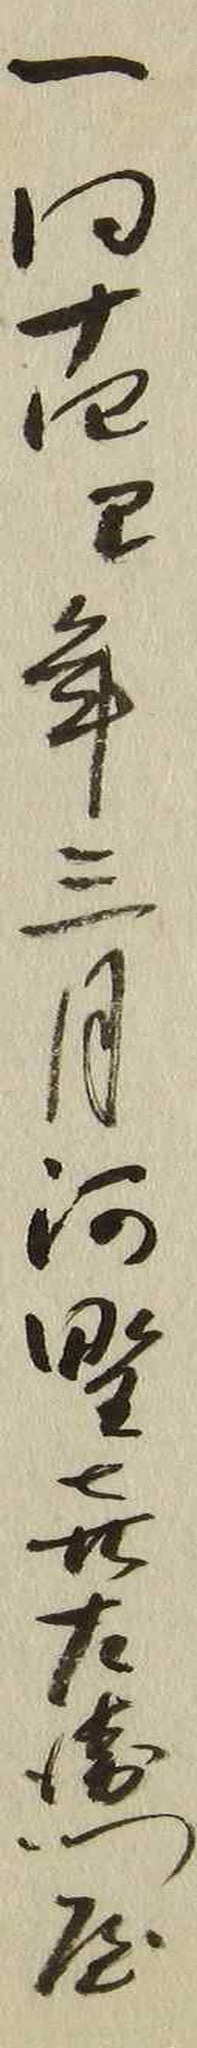一同十四巳年三月河野喜左衛門屋
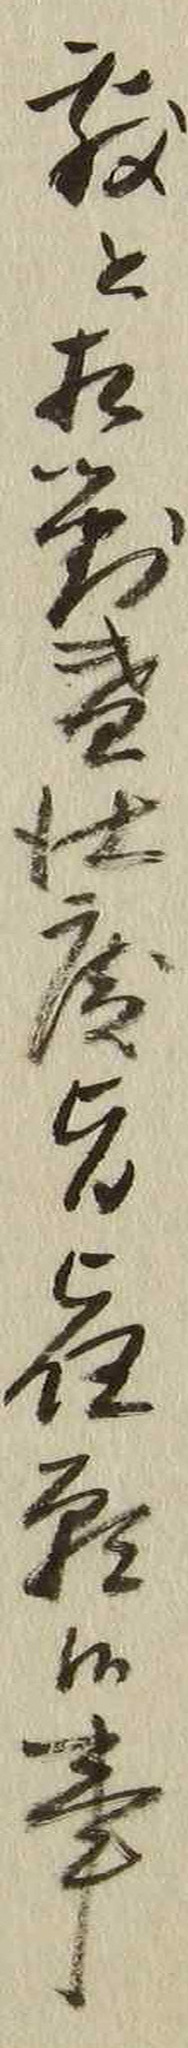敷と相対替仕度旨被任願候事
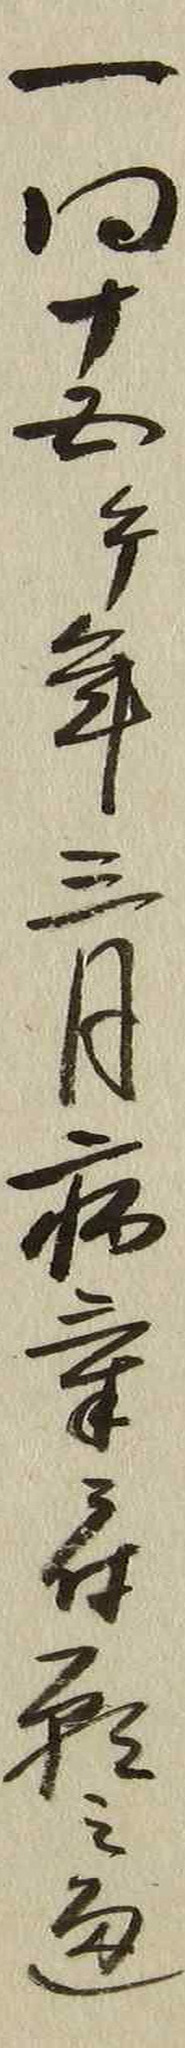一同十五午年三月病気ニ付願之通
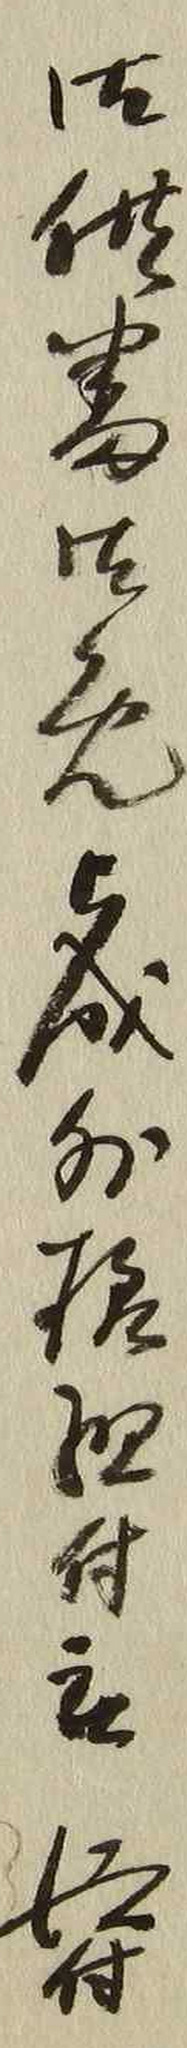御供番御免被成外様組付被仰付
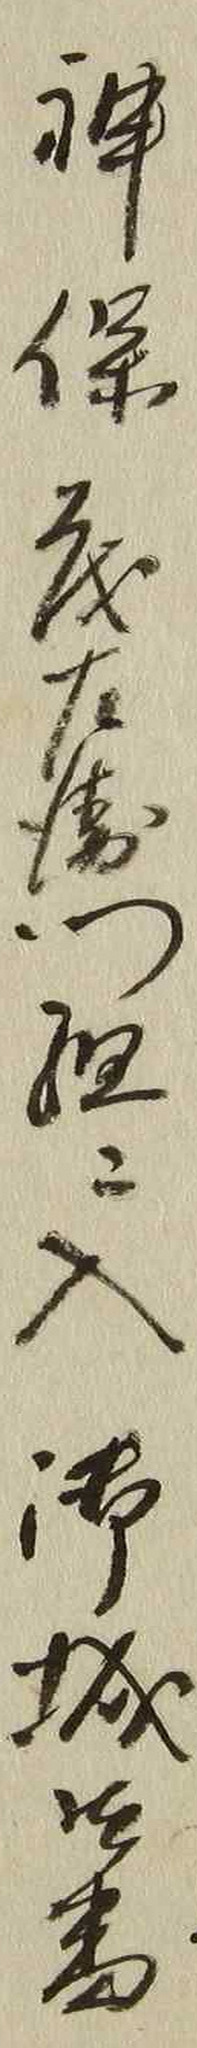神保茂左衛門組ニ入御城御番
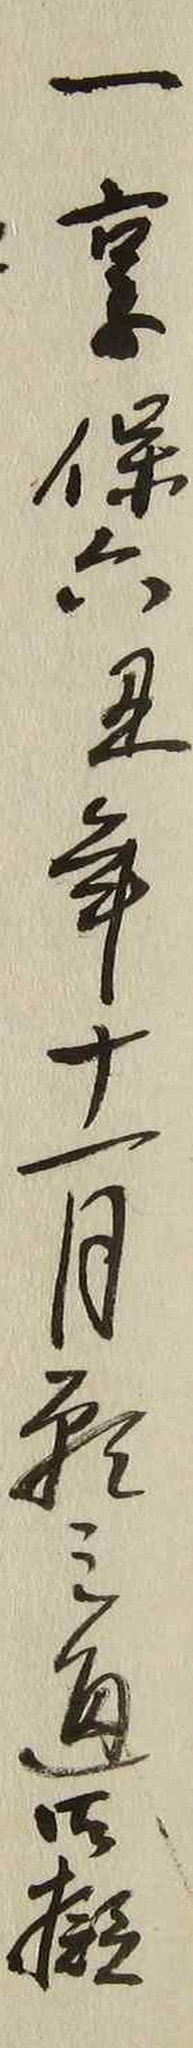一享保六丑年十一月願之通御擬
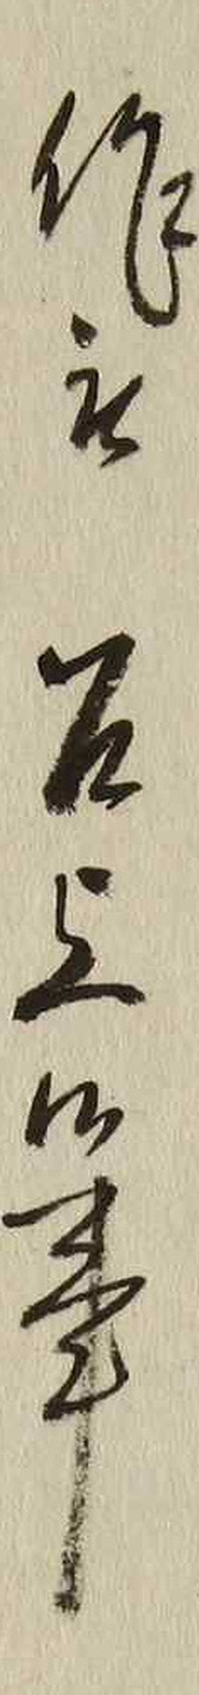作被召上候事
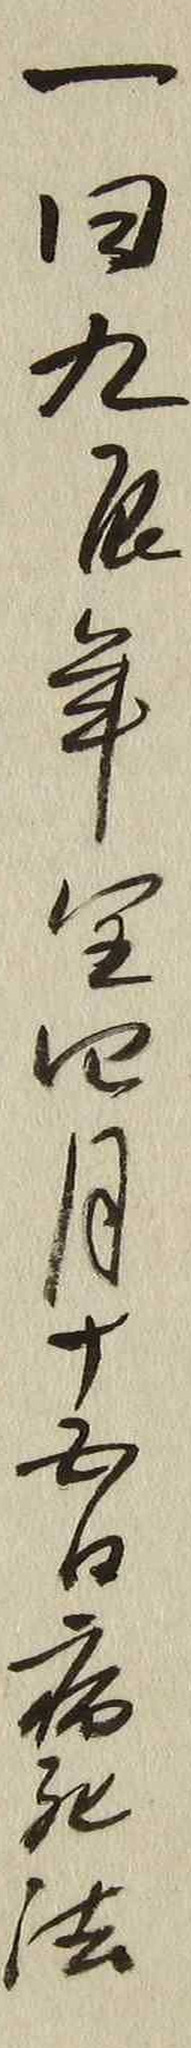一同九辰年閏四月十五日病死法
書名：諸士系譜　巻之359　す之部9
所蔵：会津若松市立会津図書館
